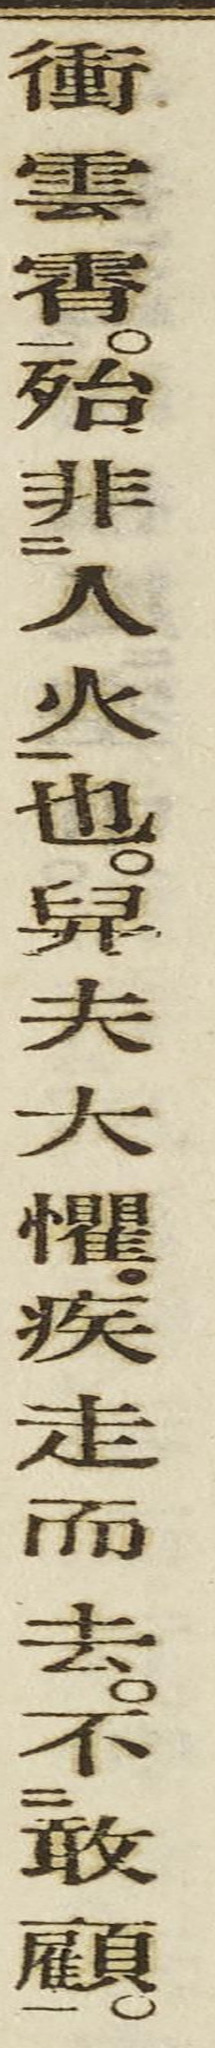衝雲霄。殆非ニ人火也。舁夫大懼疾走而去。不ニ敢顧。
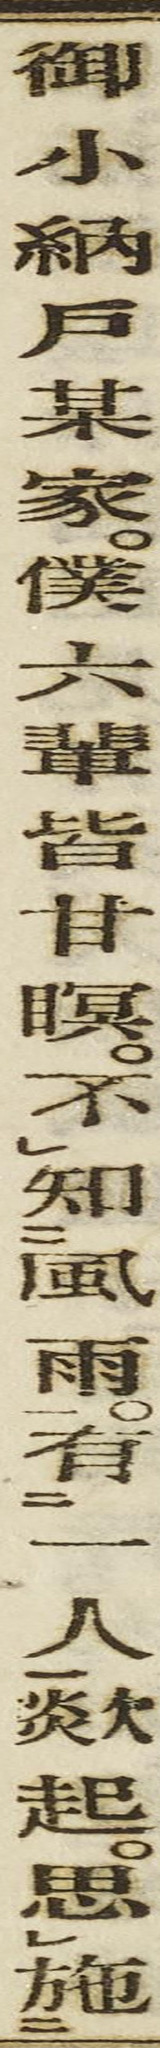御小納戸某家。僕六輩皆甘瞑。不知ニ風雨。有ニ一人欻起。思施ニ
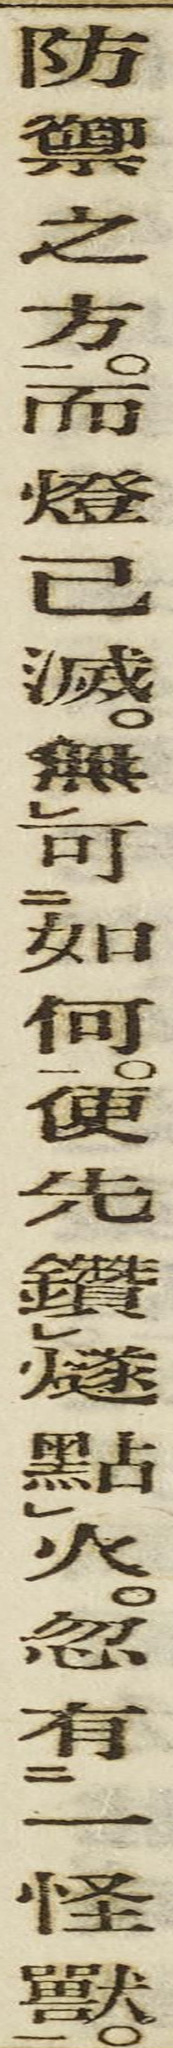防禦之方。而燈己減。無可ニ如何。便先鑽燧点火。忽有ニ一怪獣。
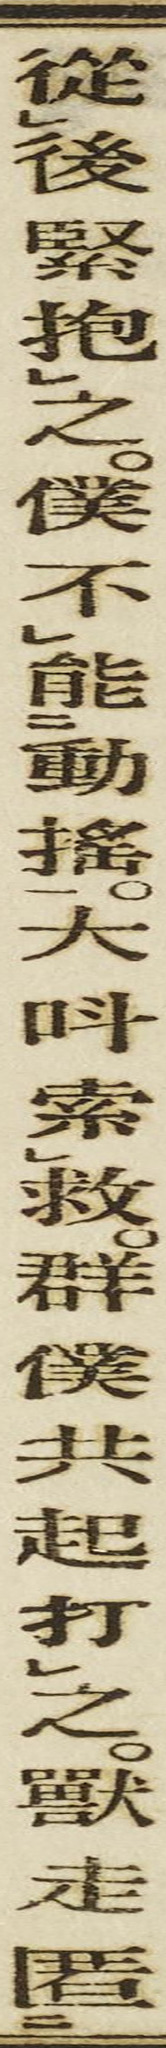従後緊抱之。僕不能ニ動揺。大叫索救。群僕共起打之。獣走匿ニ
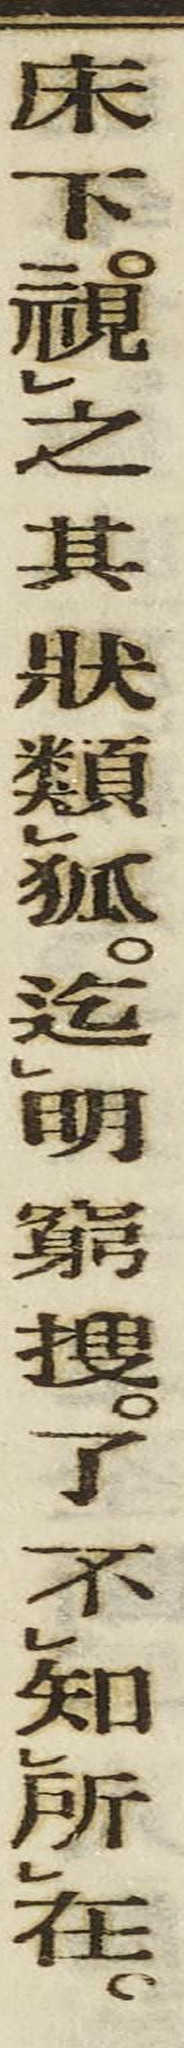床下。視之其状類狐。迄明窮捜。了不知所在。
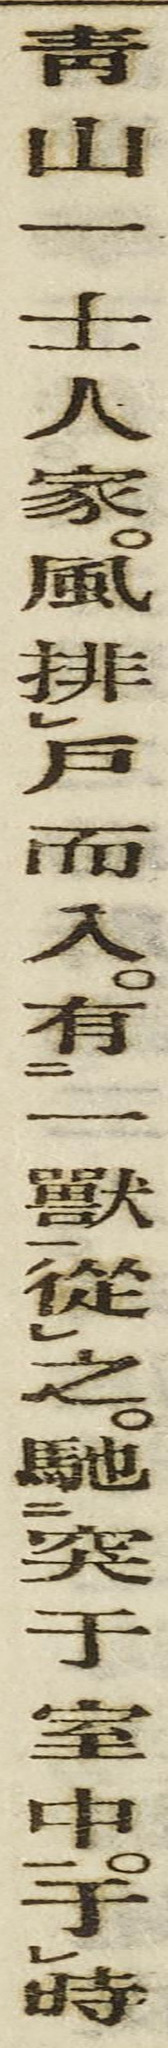青山一士人家。風排戸而入。有ニ一獣従之。馳ニ突于室中。于時
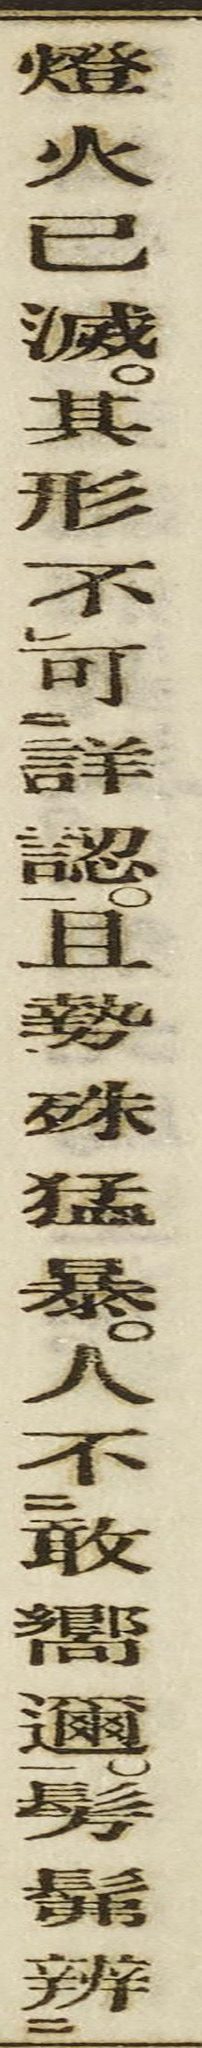燈火己減。其形不可ニ詳認。且勢殊猛暴。人不ニ敢嚮邇。髣髴弁ニ
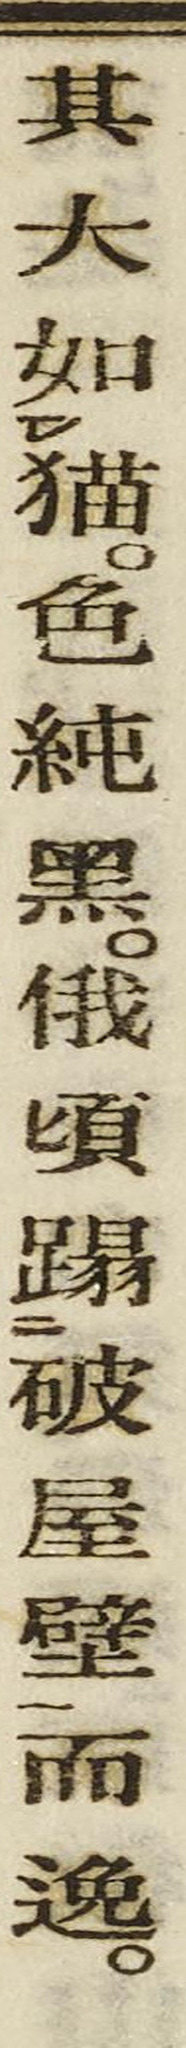其大如レ猫。色純黒。俄頃蹋ニ破屋壁而逸。
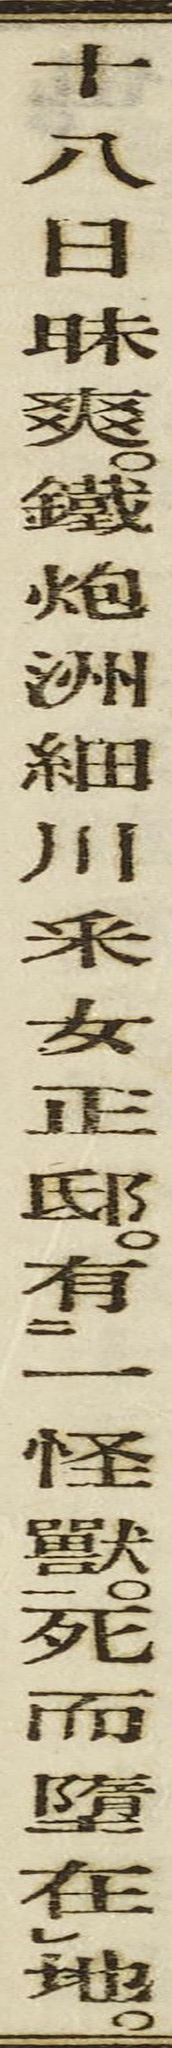十八日昧爽。鉄砲洲細川采女正邸。有ニ一怪獣。死而堕在地。
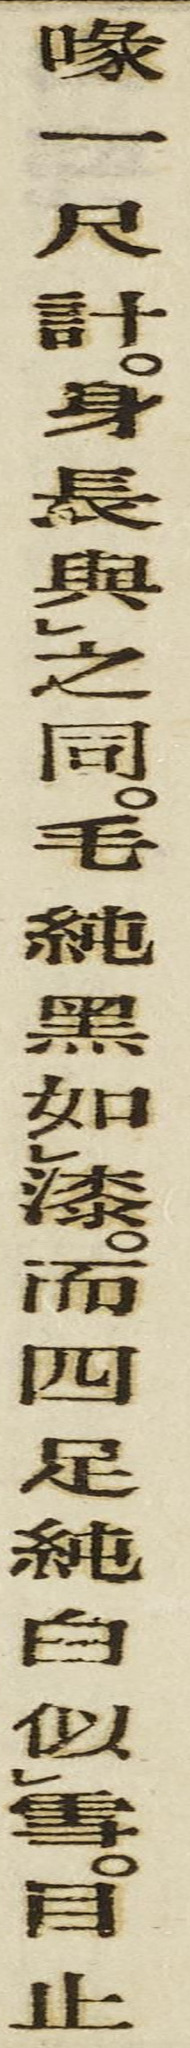喙一尺計。身長与之同。毛純黒如漆。而四足純白似雪。目止
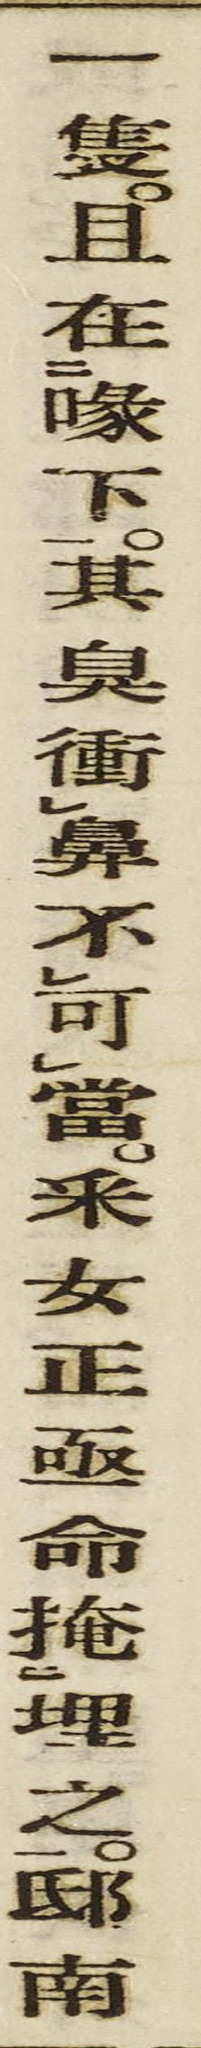一隻。且在ニ喙下。其臭衝鼻不可当。采女正亟命掩ニ埋之。邸南
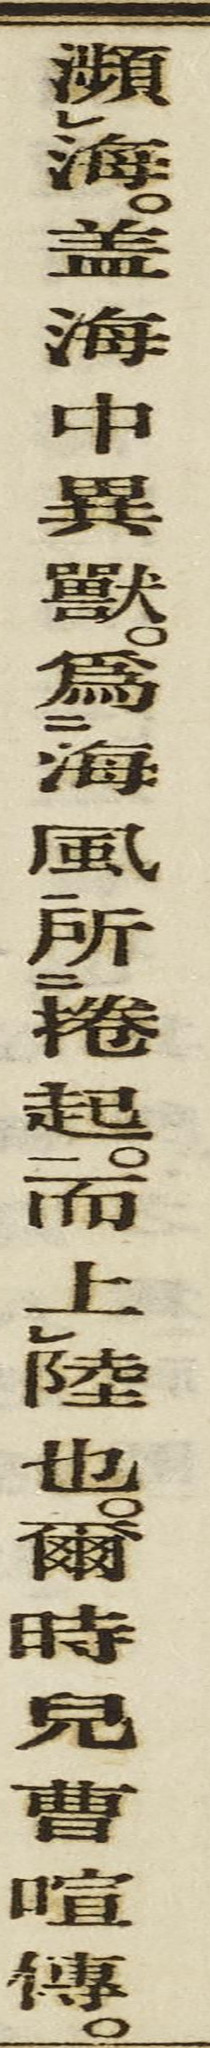瀕海。盖海中異獣。為ニ海風所ニ捲起。而上陸也。爾時皃曹喧伝。
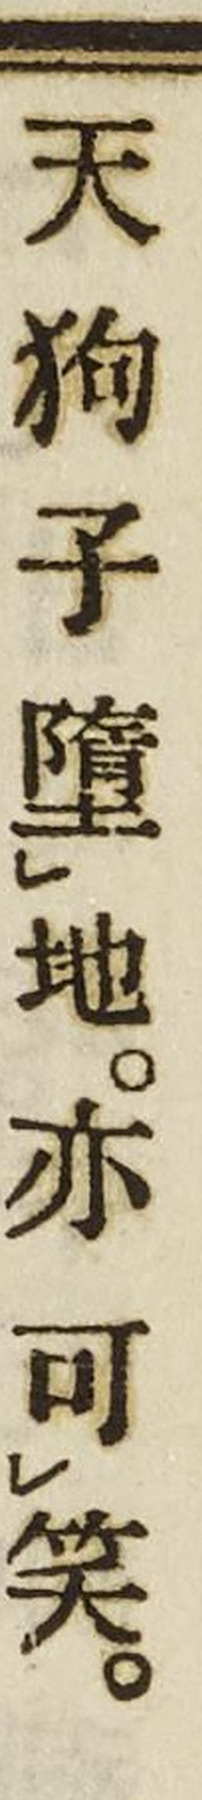天狗子堕地。亦可笑。
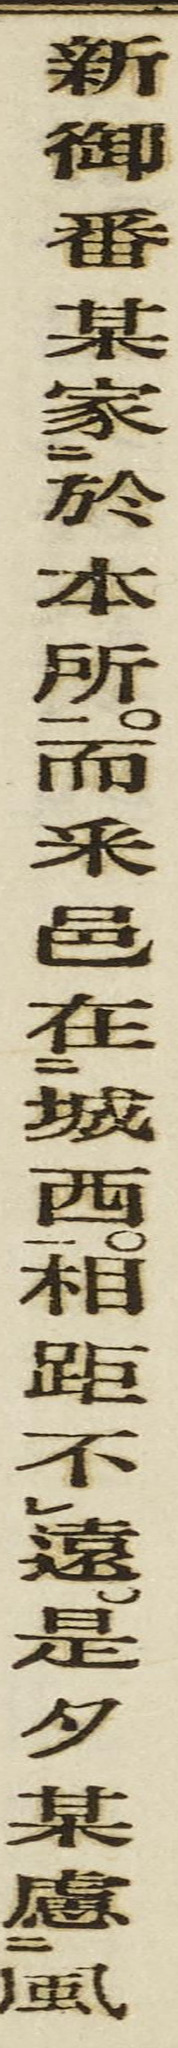新御番某家ニ於本所。而采邑在ニ城西。相距不遠。是夕某慮ニ風
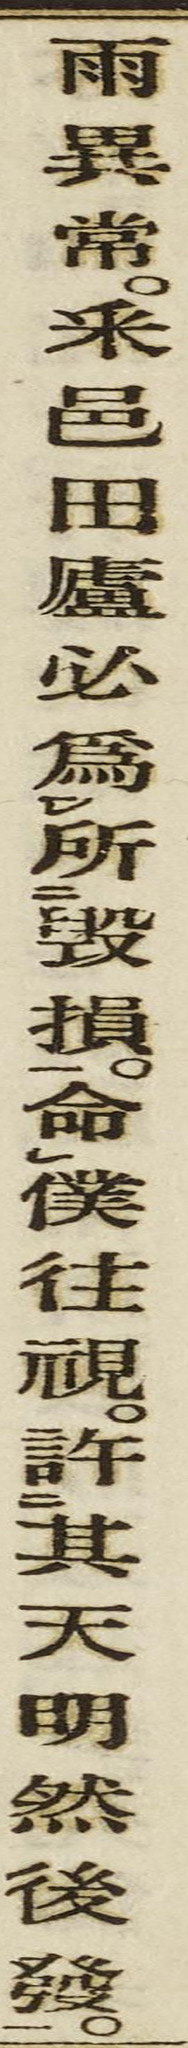雨異常。采邑田廬必為所ニ毀損。命僕往視。許ニ其天明然後発。
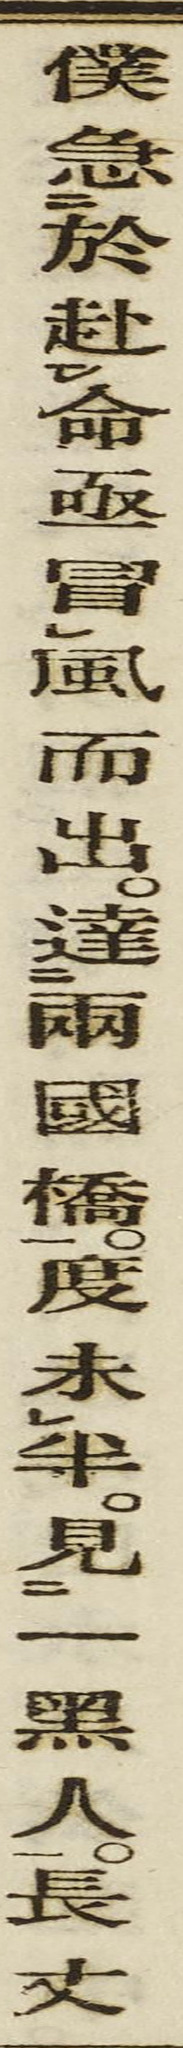僕急ニ於赴レ命亟冐風而出。達ニ両国橋。度未半。見ニ一黒人。長丈
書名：史籍集覽　朝鮮陣古文・細井廣澤記・颶風紀事・天明七年將軍宣下次第書　全
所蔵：東京大学地震研究所図書室 Earthquake Research Institute Library, The University of Tokyo, JAPAN
